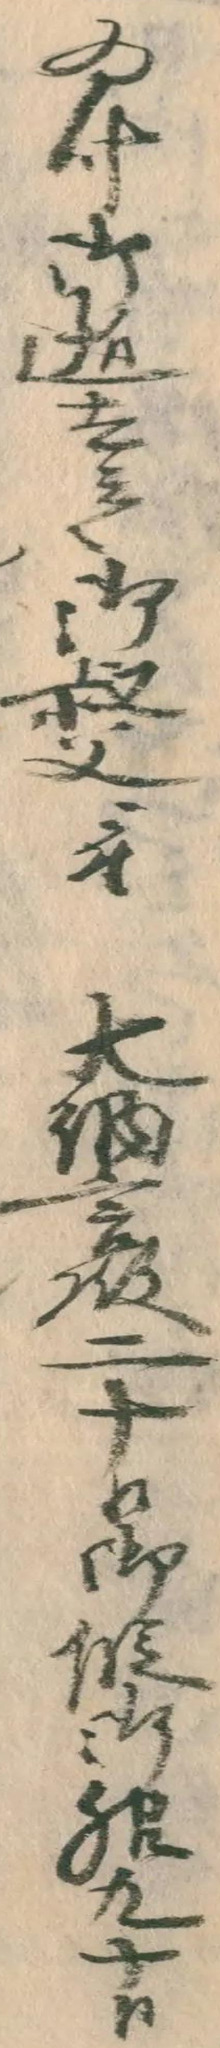為叶御逝去云々御叔父ニ付大納言殿二十日御仮御服九十日
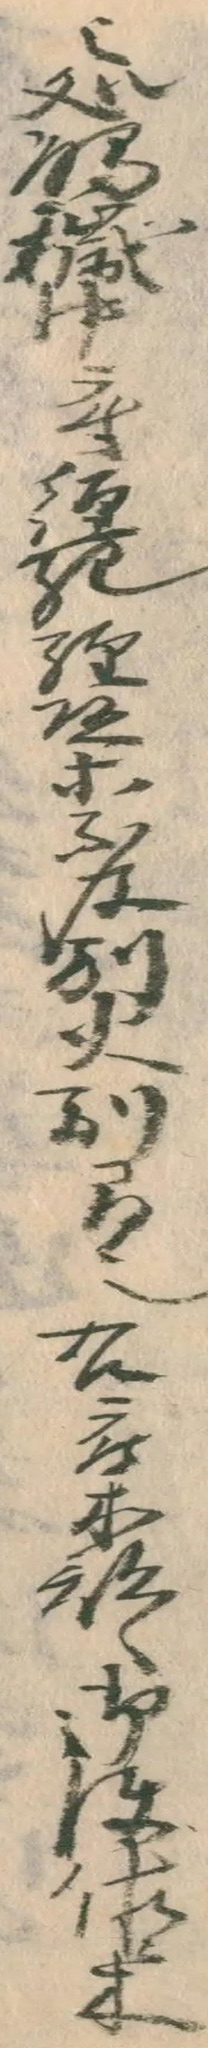之処觸穢中ニ付経紀経啓等不及別火別間也右ニ付木舩へ御使佐々木
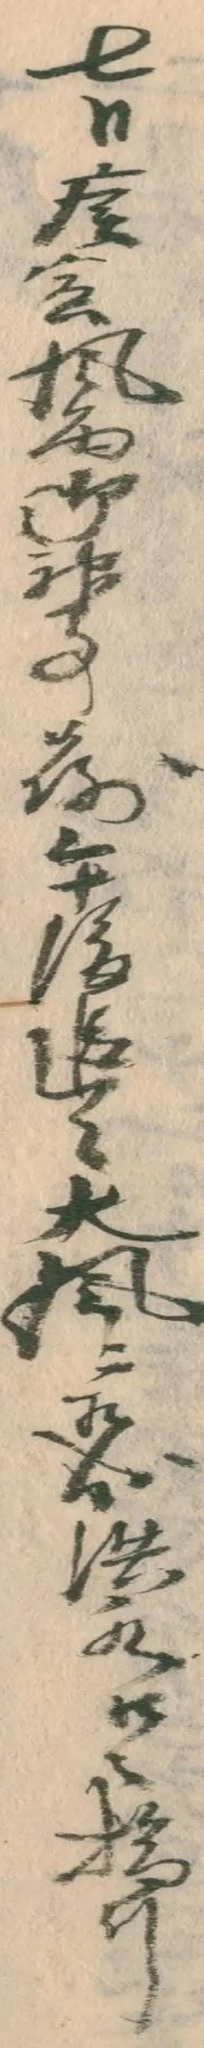七日庚寅風雨御神事如例午後追々大風二相成洪水云々橋引
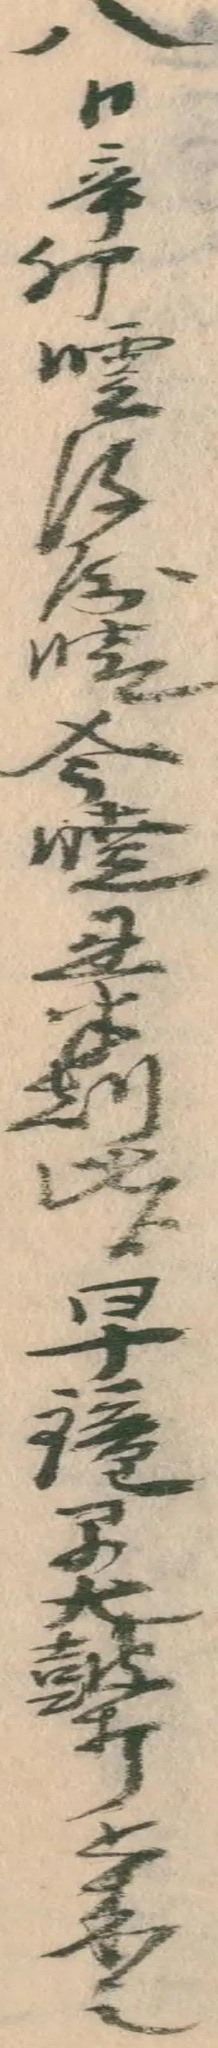八日辛卯曇後属晴今暁丑半刻頃ゟ早鐘早大皷打近来之
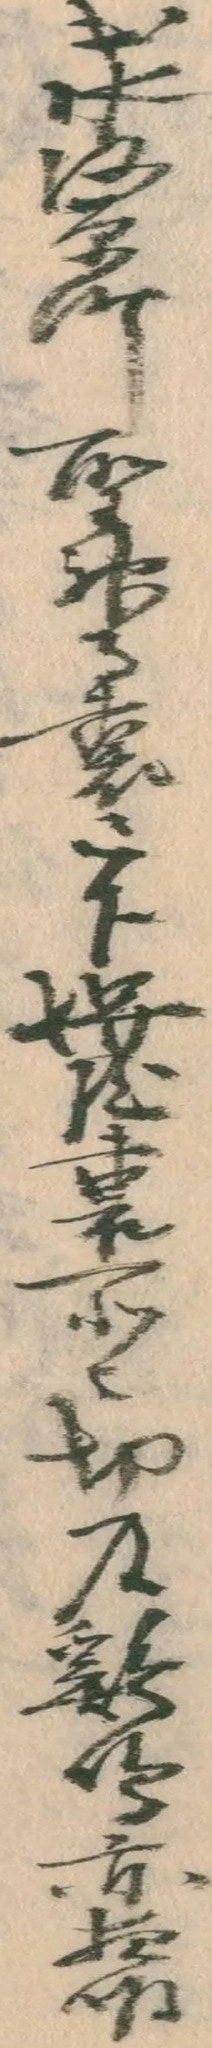出水河原町聖神寺裏已下堺屋裏所々切及数鳴亦夜明
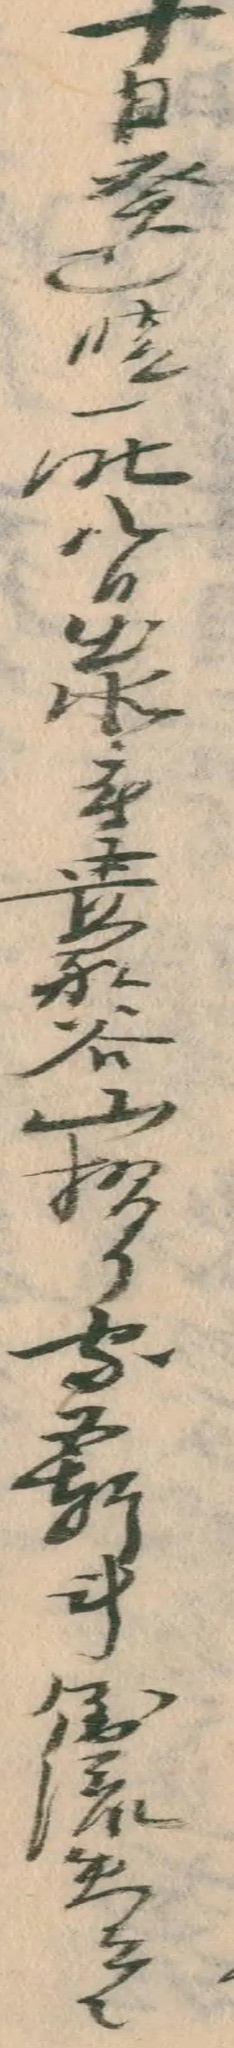十日癸巳晴一昨八日出水ニ付貴舩谷山摺り家五軒斗倒流失云々
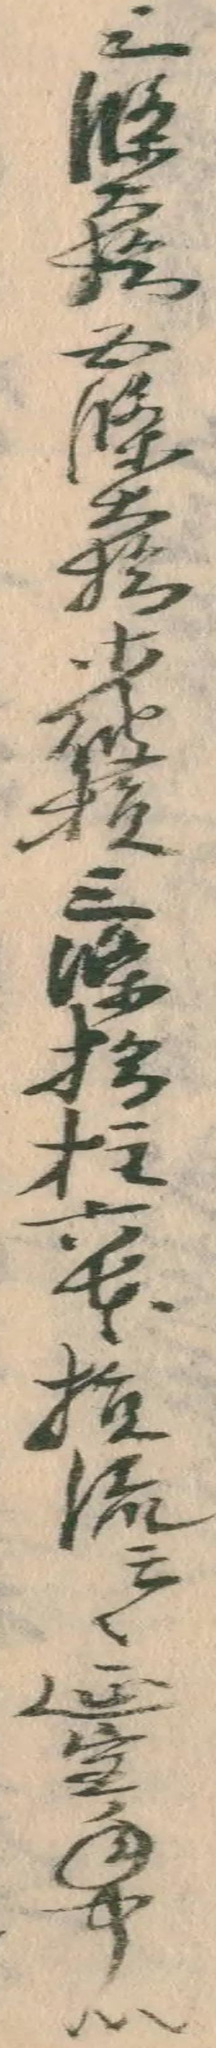三條大橋五條大橋等破損三條橋柱六本損流云〻延宝年中以
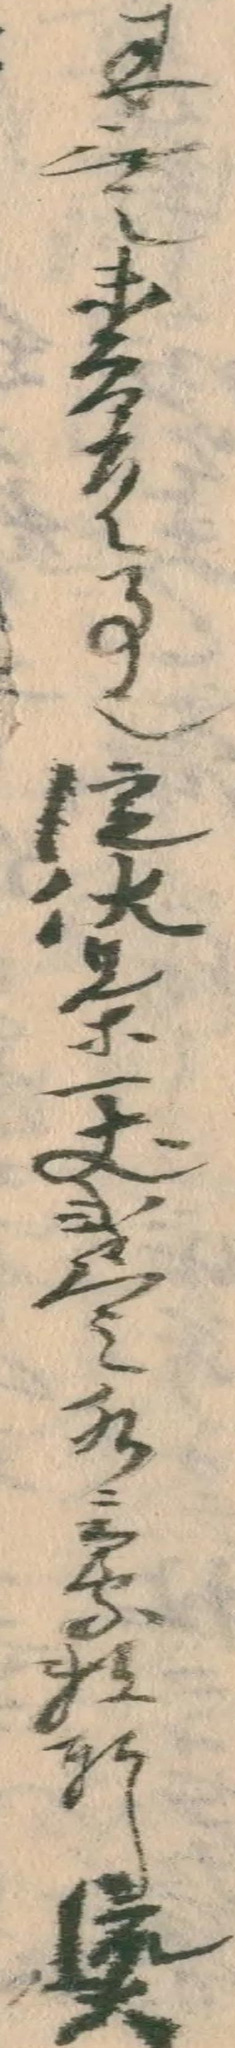来無之未曽有之事也淀伏見等一丈弐尺之水に而家数軒流失
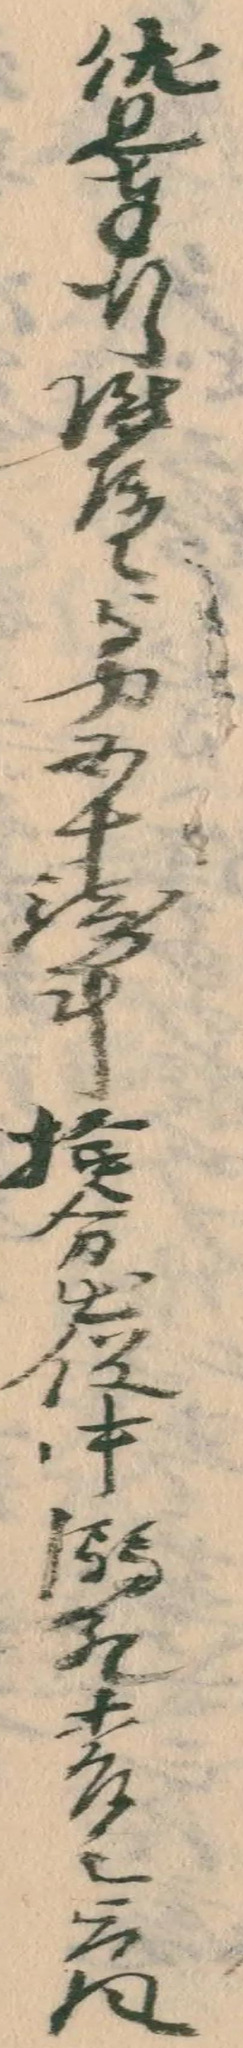伏見奉行附屋之与力五十銭斗検分出役中溺死等有之旨風
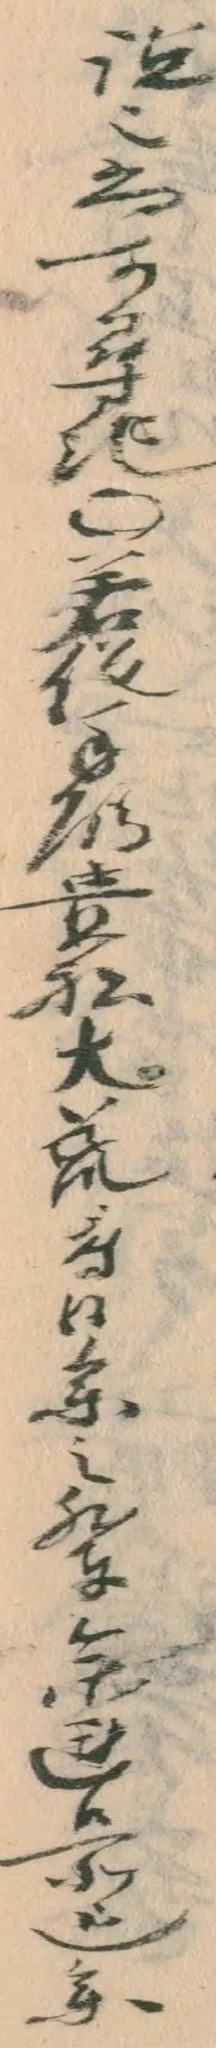説也尚可尋記○若役手觸貴舩大荒ニ付日参之輩参連候所迄参
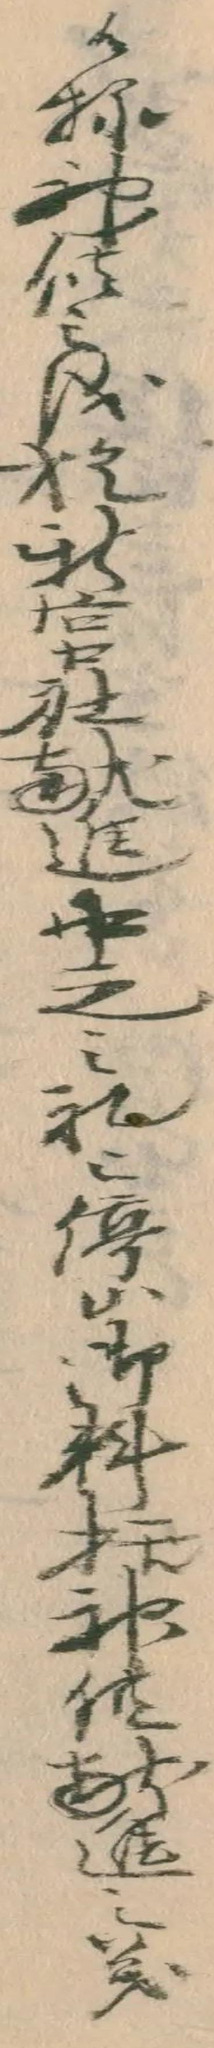候様神供之儀於新宮社献進中元之祝被停出御料様神供献進之義
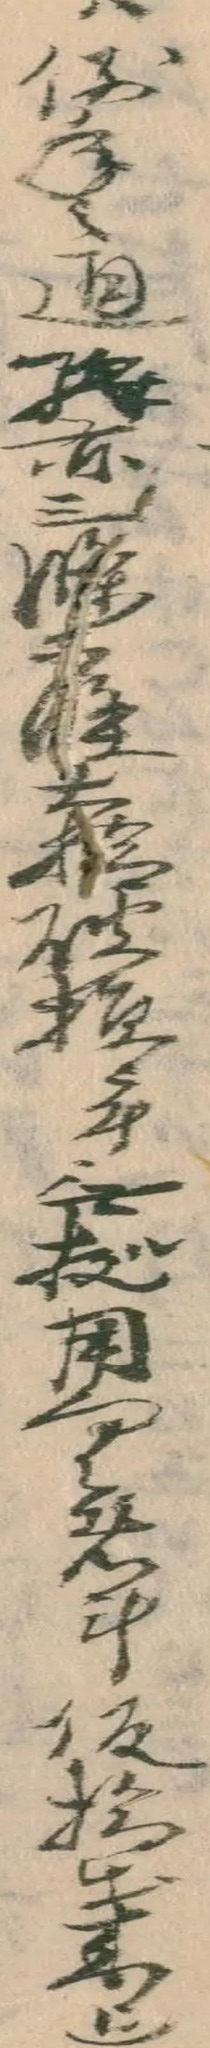ハ例年之通殊亦三條五條大橋破損ニ付無拠用向之者斗仮橋出来迄
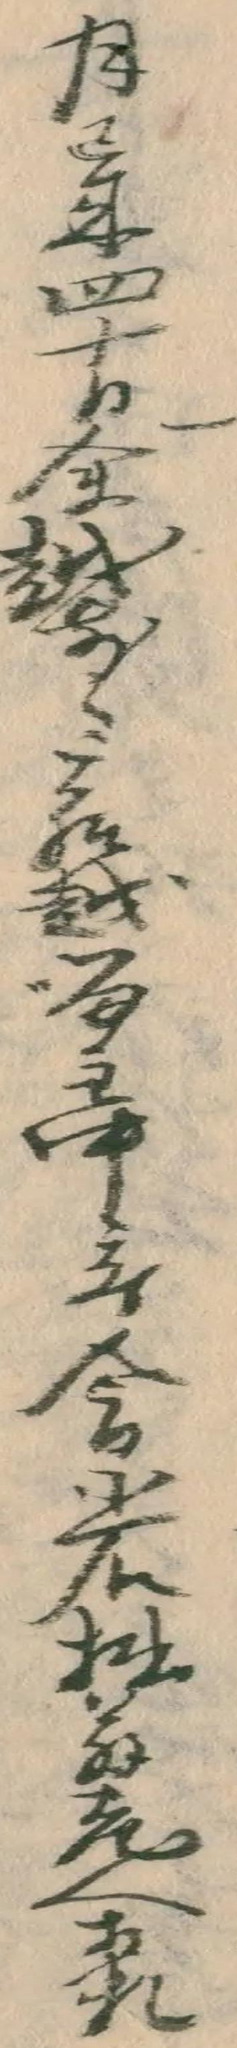月已来四十日余越前へ被罷越留守中ニ付今日小右拙翁老人相頼
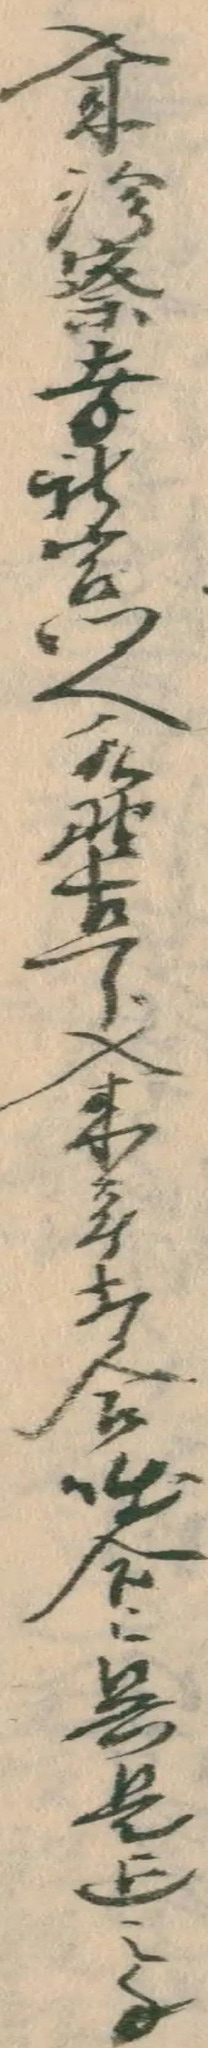入来珍察幸新宮門人水野古一郎入来ニ付打合咄合被呉是迄之手
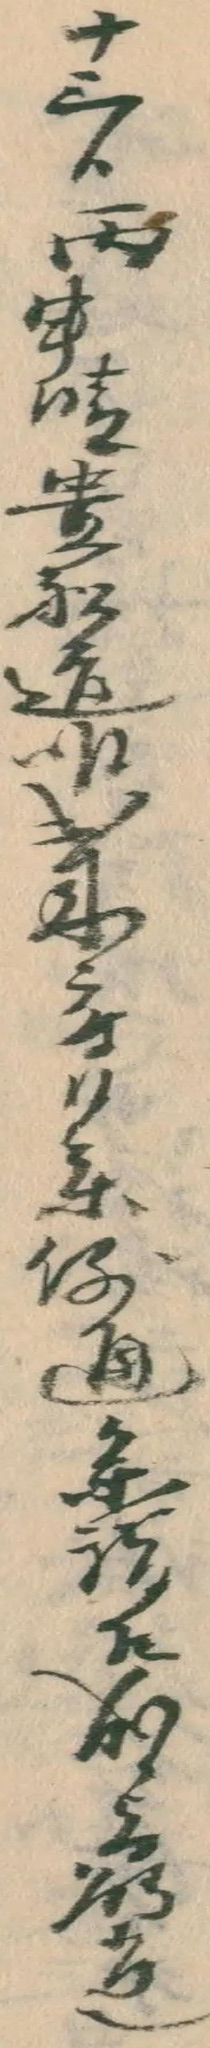十三日丙申晴豊舩道明出来ニ付日参例通参詣相成候旨觸有也
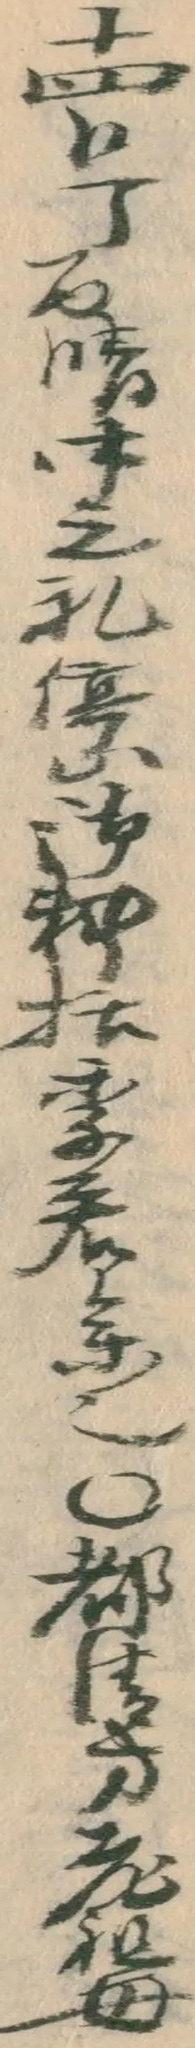十四日丁酉晴中元礼停止御料括季若参也○都清方老祖母
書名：賀茂社記録. 第70冊
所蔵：国立国会図書館 National Diet Library, JAPAN
